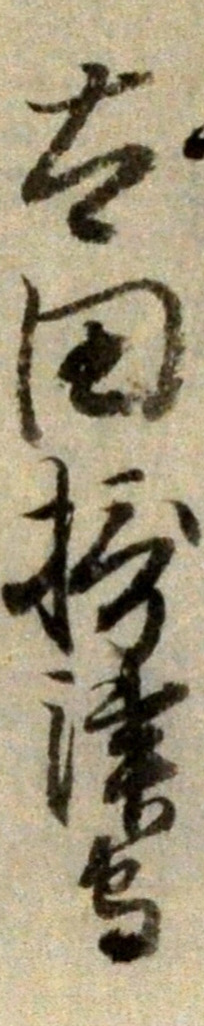太田摂津守
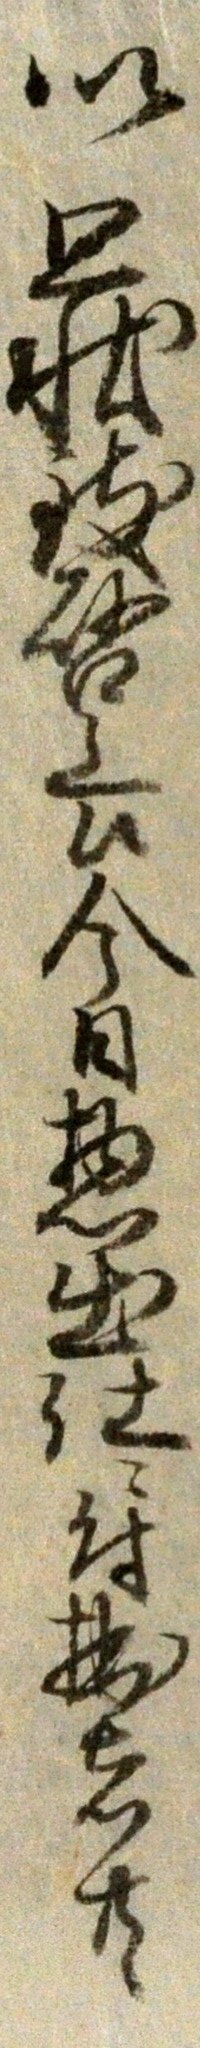以廻状致啓上候今日惣出仕に付拙者共
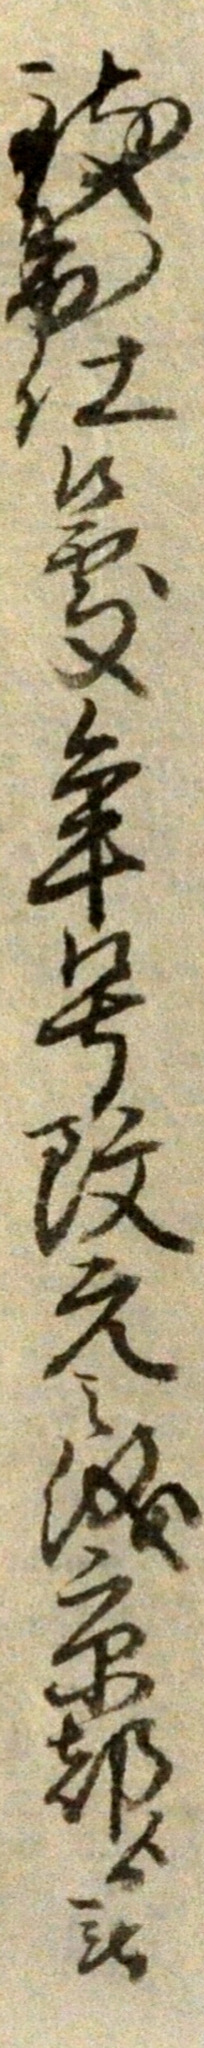致出仕候処年号改元之儀京都ゟ被
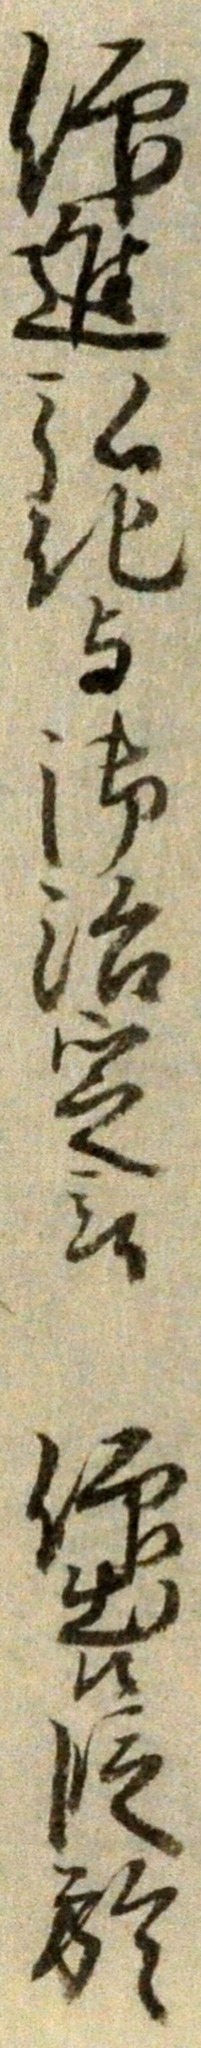仰進弘化と御治定被仰出候段於
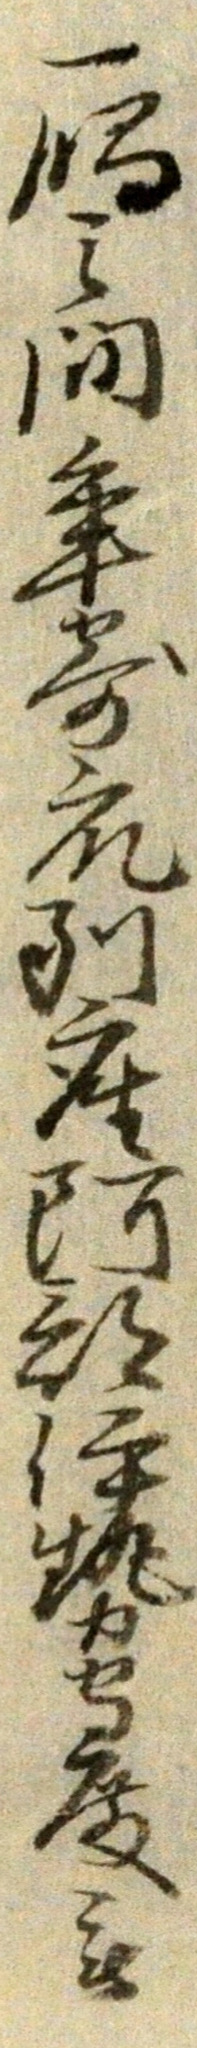雁之間年寄衆列座阿部伊勢守殿被
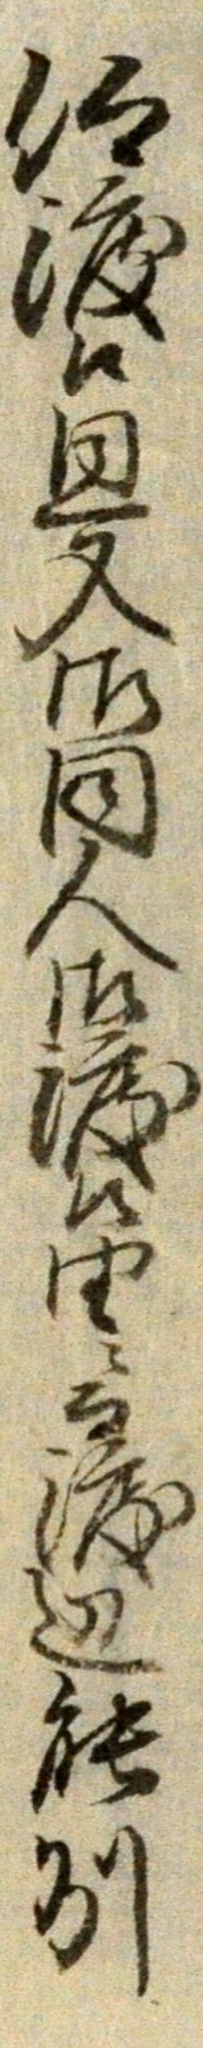仰渡候且又御同人御渡候由にて渡辺能州
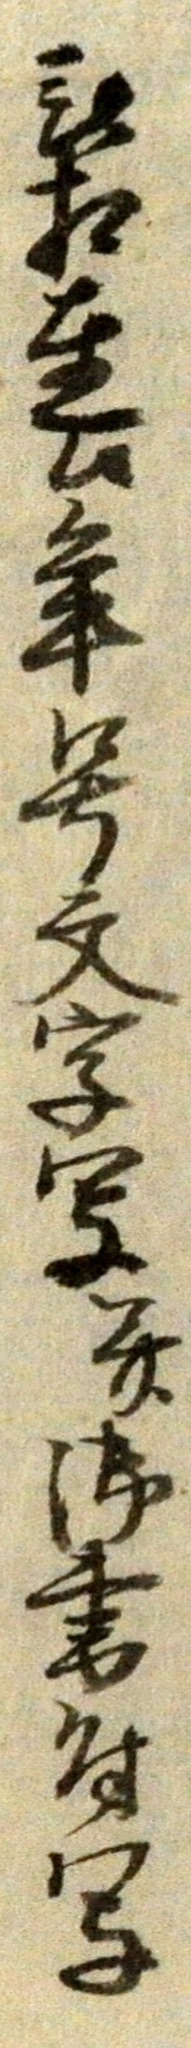被相達候年号文字写幷御書付写
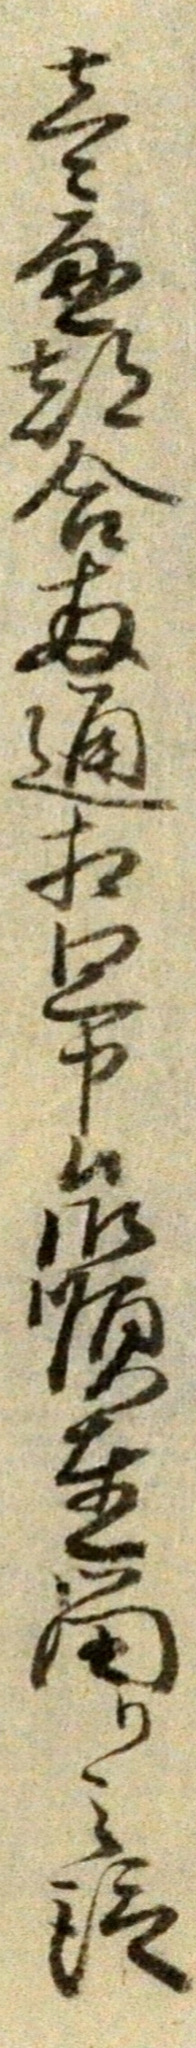壱通都合両通相廻申候御順達留り之従
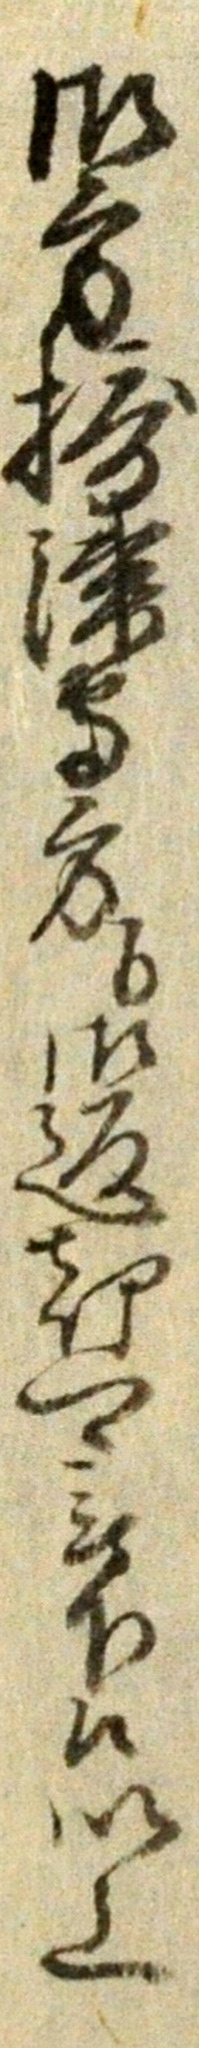御方摂津守方え御返却可被下候以上
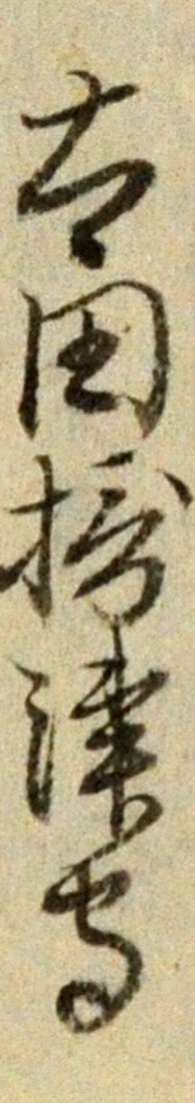太田摂津守

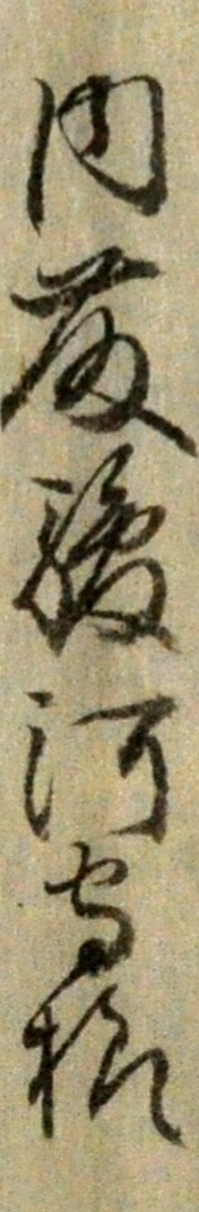内藤駿河守様
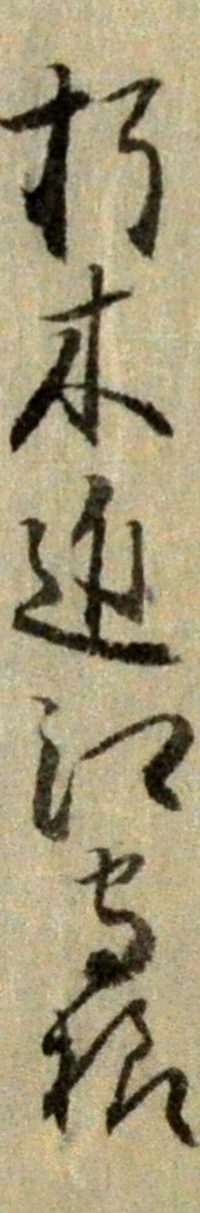朽木近江守様
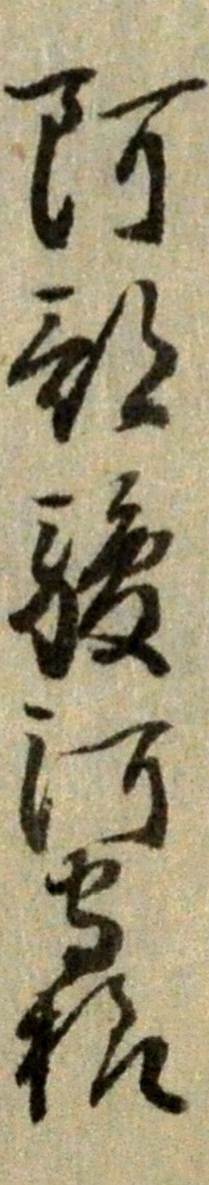阿部駿河守様
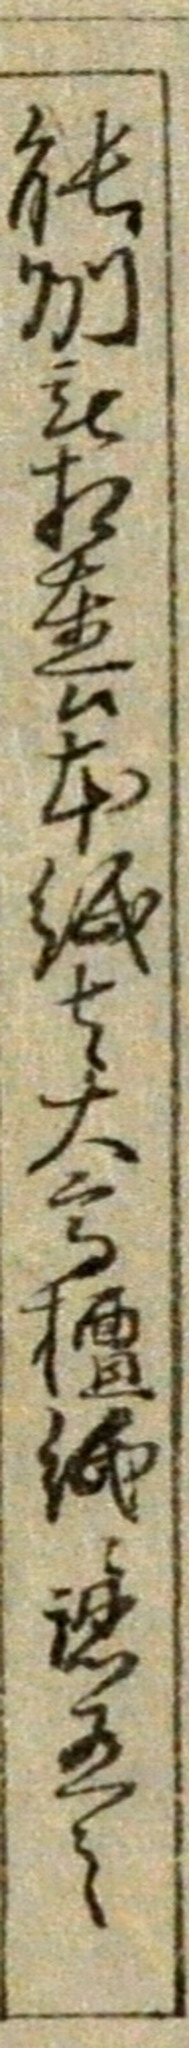能州被相達候本紙は大高檀紙に認有之
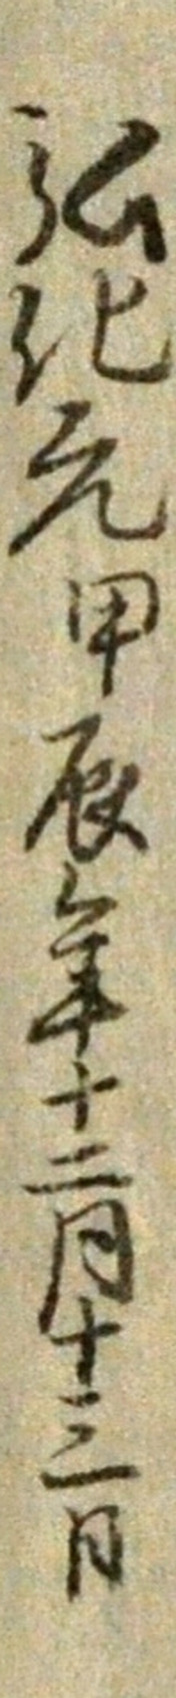弘化元甲辰年十二月十三日
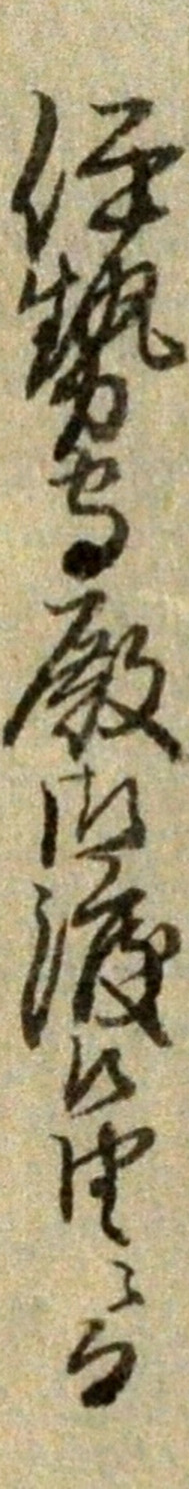伊勢守殿御渡候由にて
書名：申合帳〔一括〕
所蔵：伊那市立高遠町図書館・合同会社AMANE
